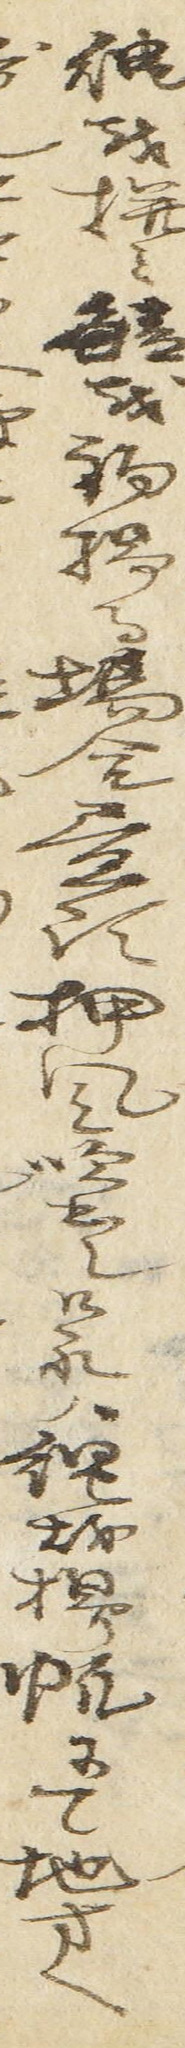縄を拼て鯖を釣揚る場合昼頃押風吹出しけれは縄を揚帆にて地方へ
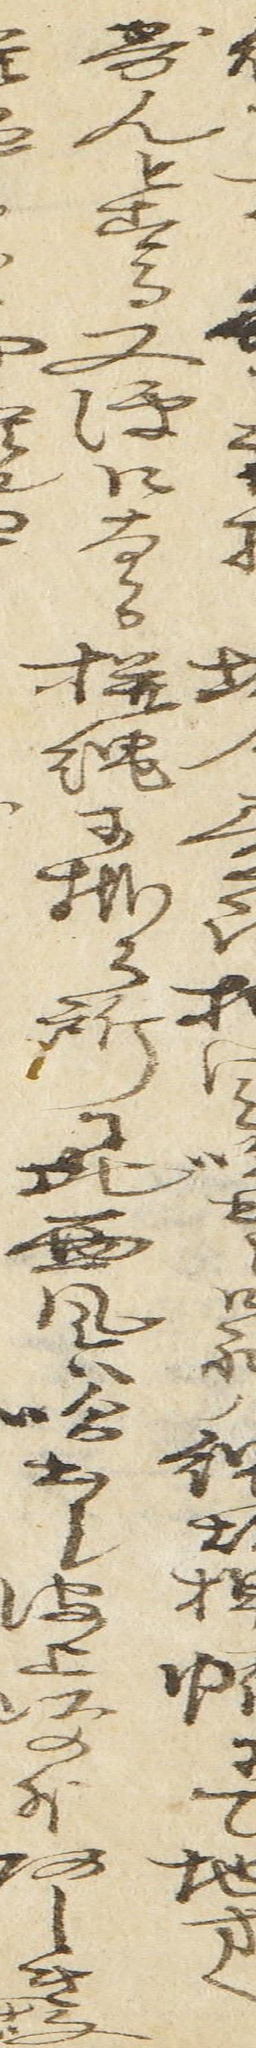寄んとする又泙になる拼縄に掛る所に此西風は吹出し波上以の外あしき故
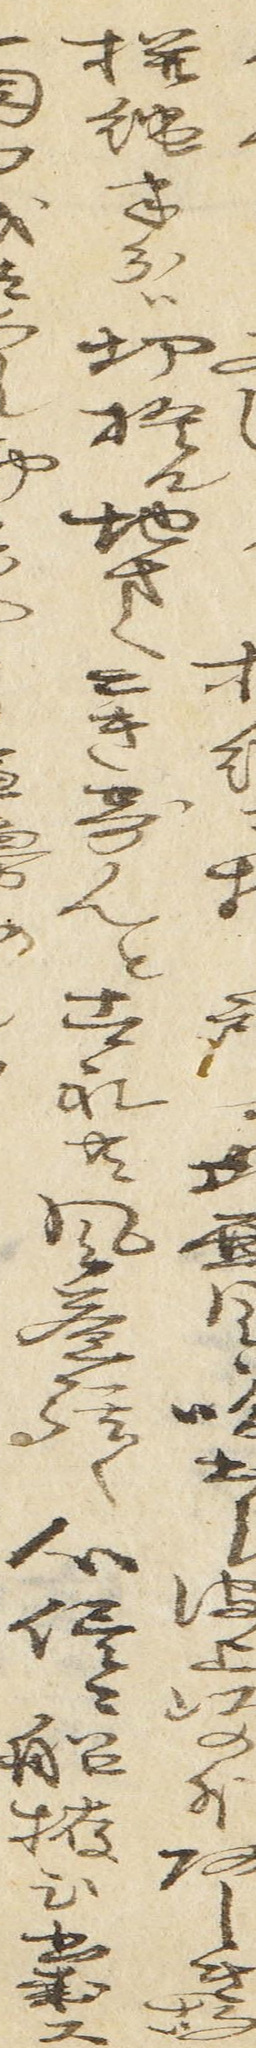拼縄半分は切捨ル地方へこき寄んとすれ共風益強く心侭に船拵ひ出来ス
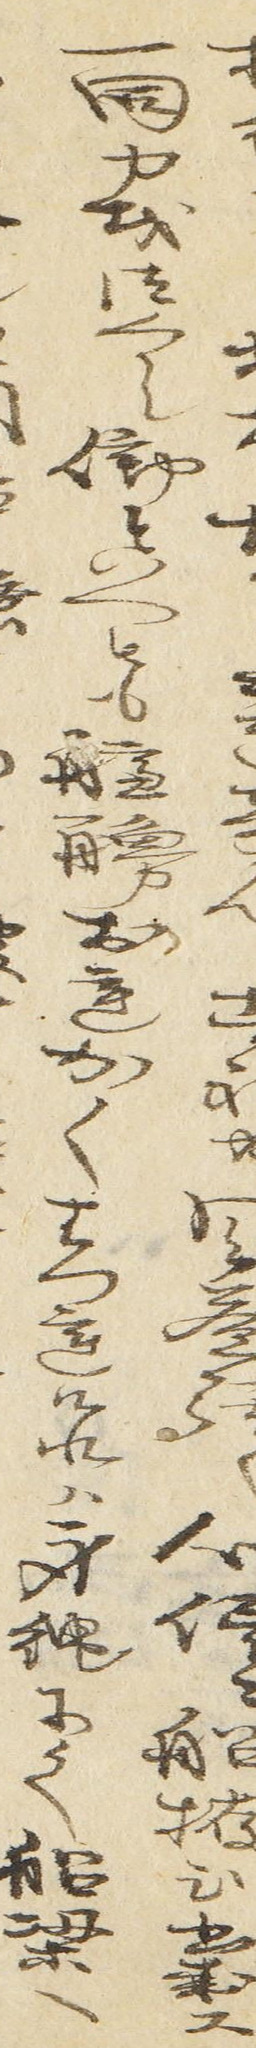一同力をつくし働といえとも艫艪おれかくはつれけれは身縄にて船梁へ
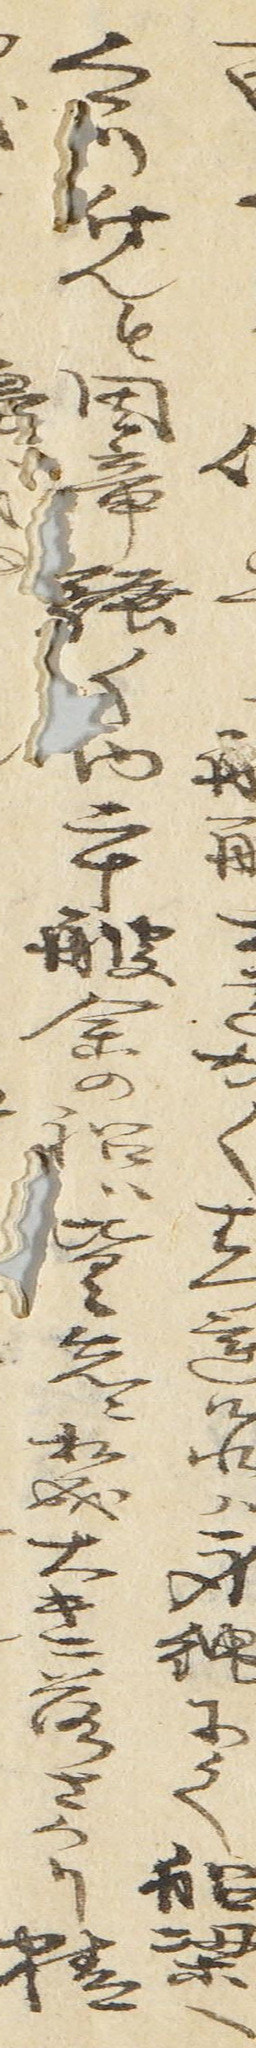くゝり付んと周章騒く内二十艘余の船は皆々先に相成大キに落さかり精
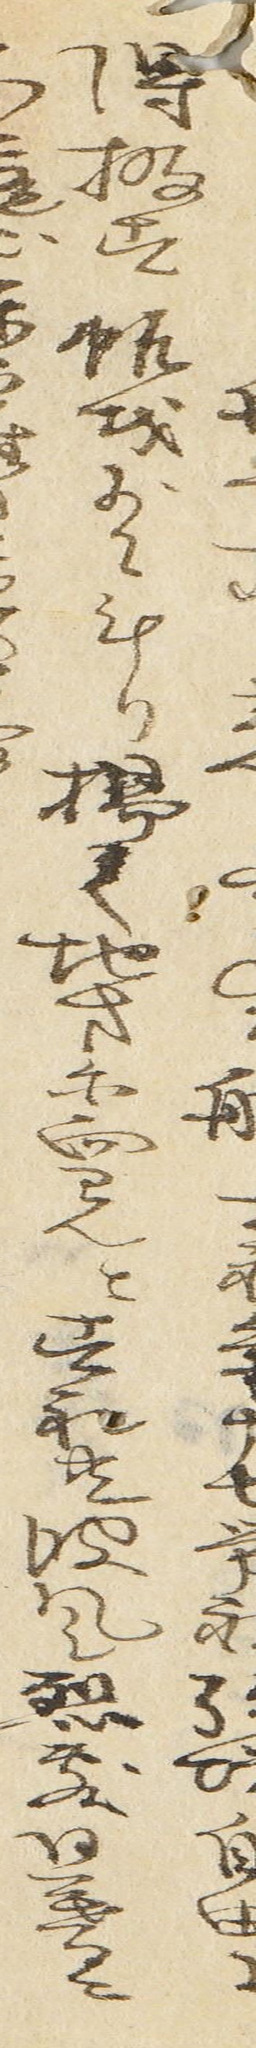得扱す帆を少々計り揚て地方に向わんとすれ共波風烈敷日暮に
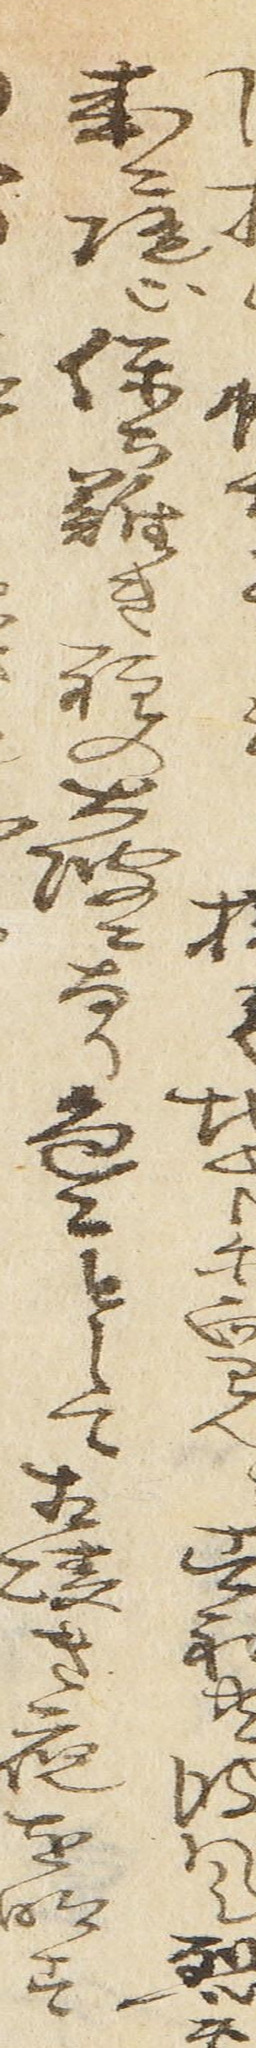成に従ひ保ち難き程の大波になり色々として相凌き夜を明す
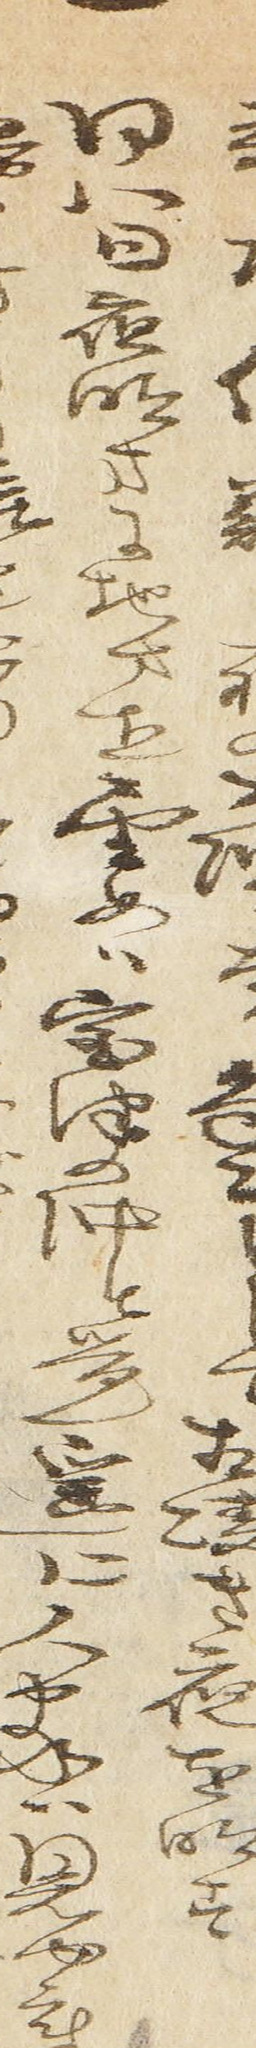一同八日夜明方に地方を望めは室津の沖と覚遥に人家は見ゆれ共
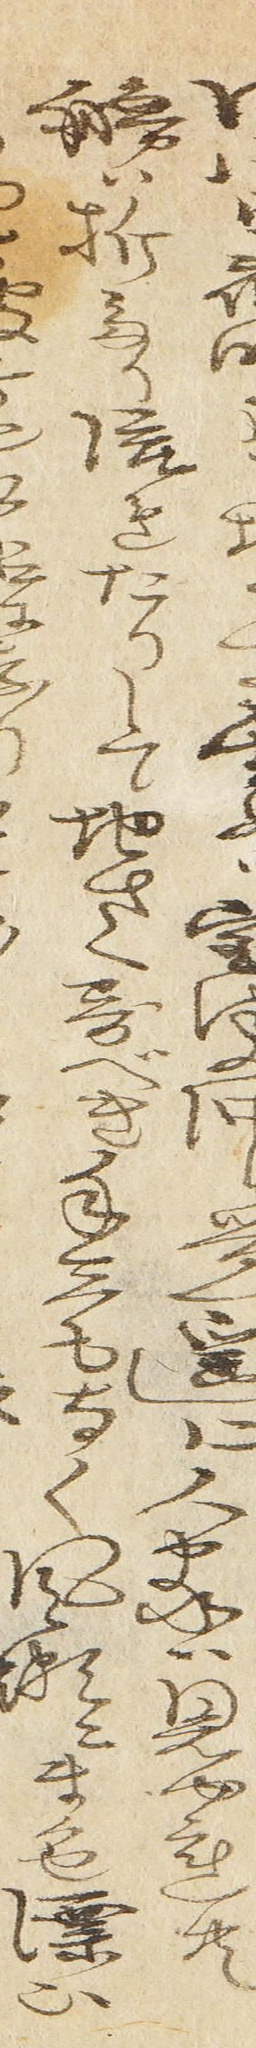艪は折たり流れたりして地方へ寄べき手立もなく風潮にまかせ漂ひ
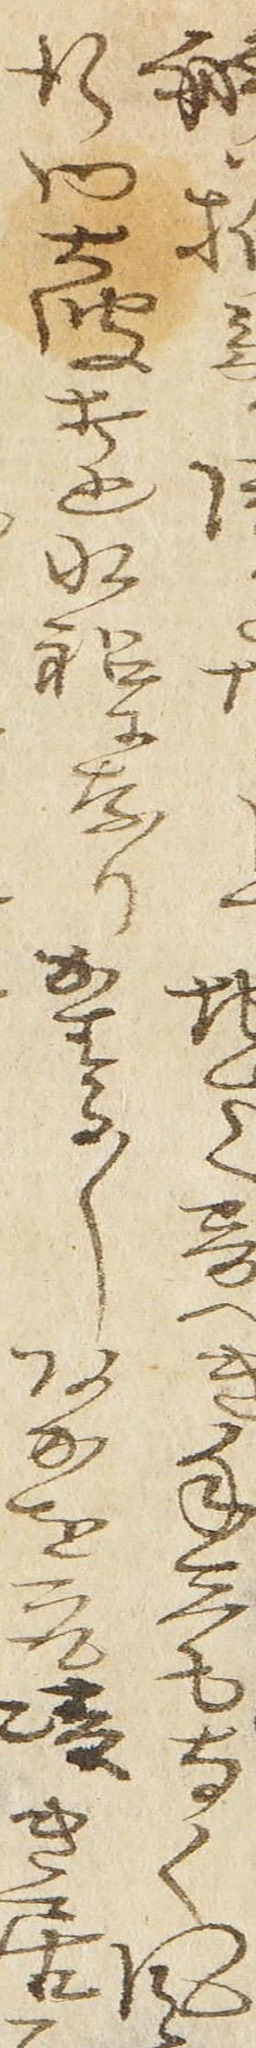行内大波打込水船になりかはる〳〵あかを取凌き居る
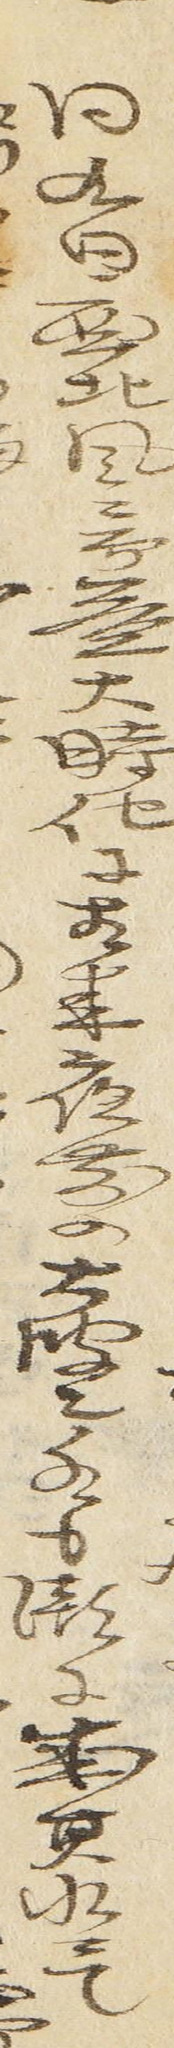一同九日西北風に而益大時化に相成夜前の大波に水も潮に成其水にて
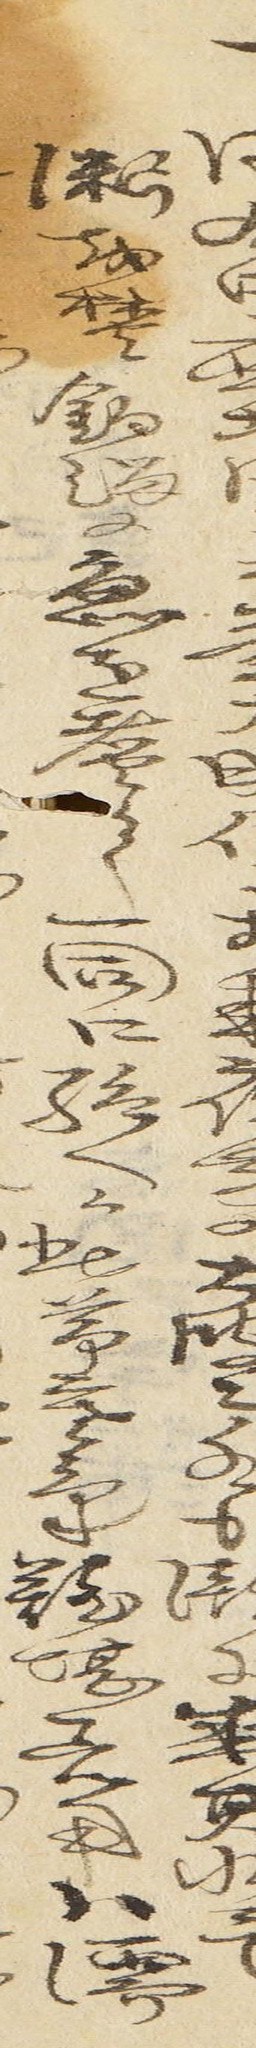粥を焚釣揚の魚を煮て一同に給へる此節に寒気難堪着用は濡
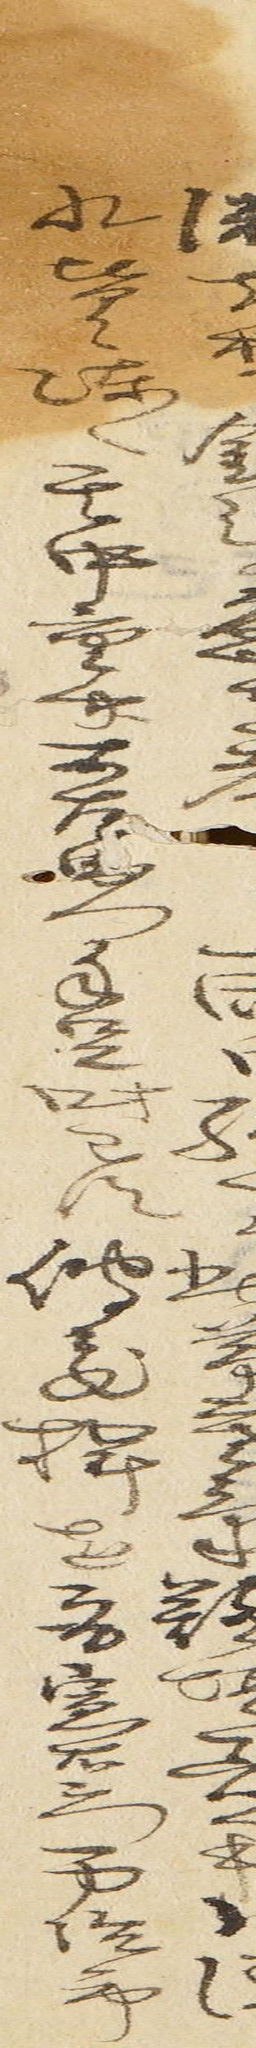れ皆々凍へ其中重介五左衛門手足叶わす伝蔵楫を取寅右エ門万治郎
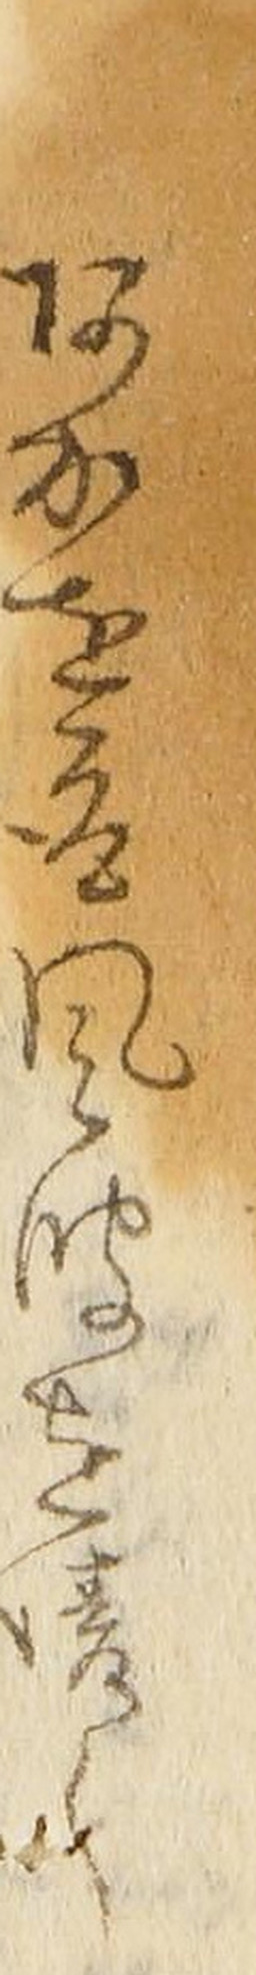あかを取風波を凌く
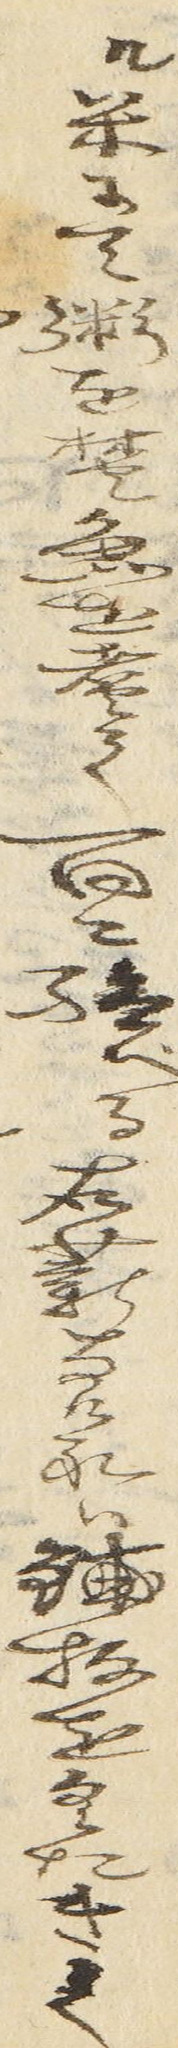ル米にて粥を焚魚を煮て一同に給べる右薪なけれは鋪板をくたきて
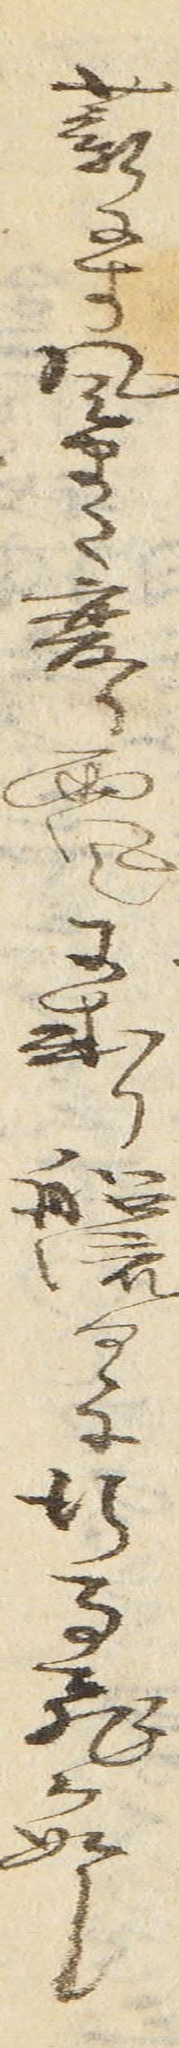薪にす風また変り西風に成り船流るゝに行事飛か如し
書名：難船人帰朝記
